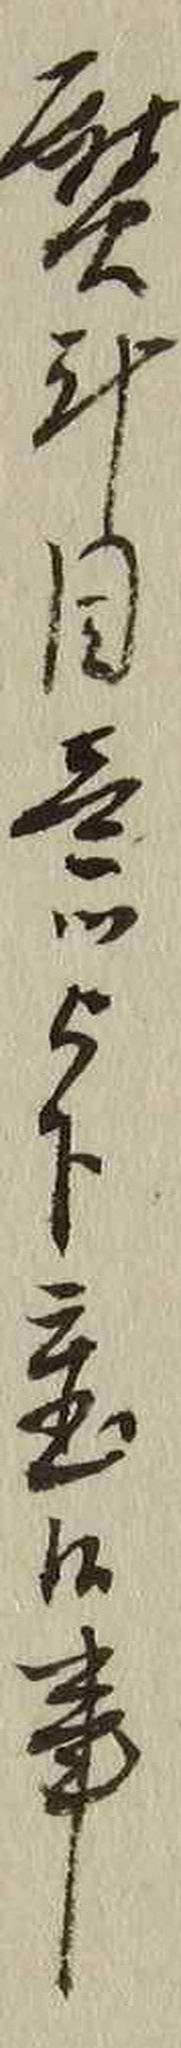熨斗目壱ツ被下置候事
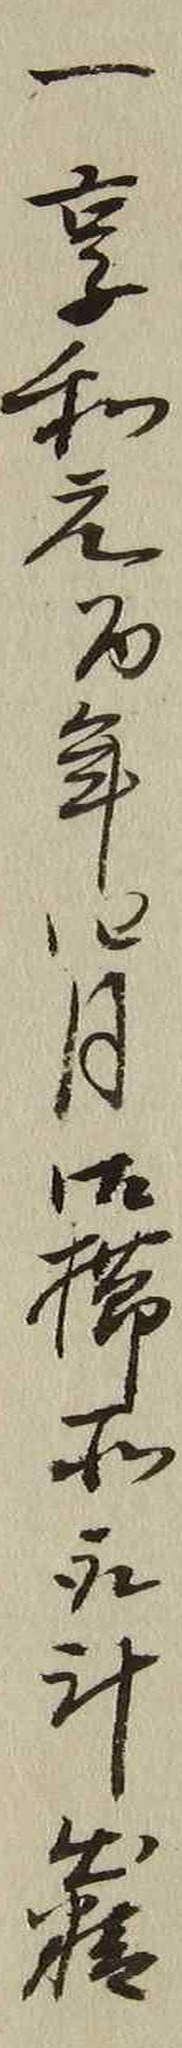一享和元酉年四月御櫛所取計出精
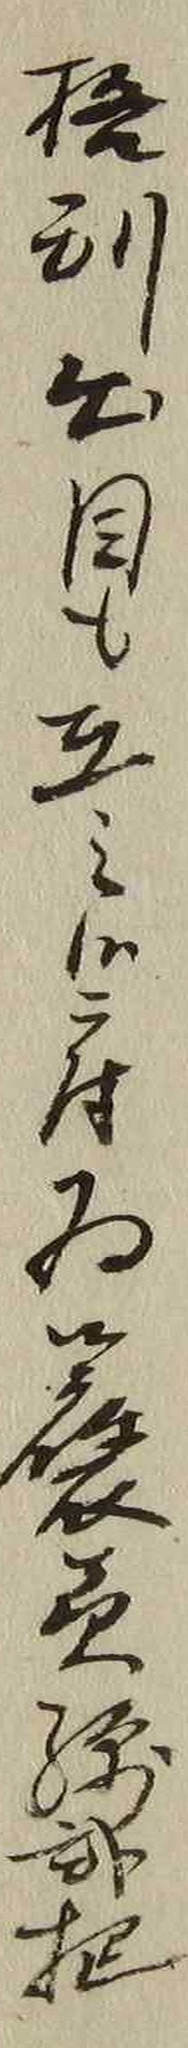格別出目も在之候ニ付為御褒美綿弐把
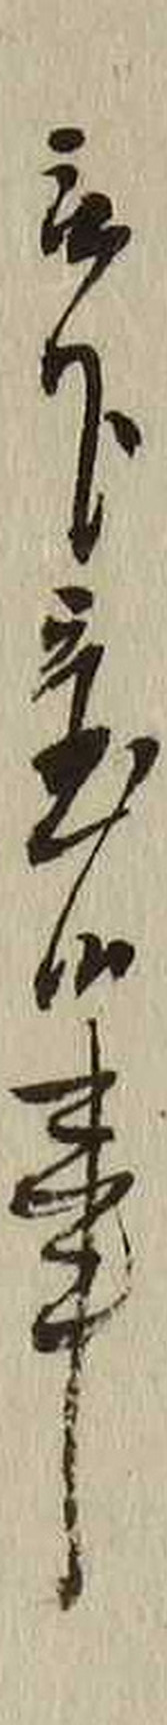被下置候事
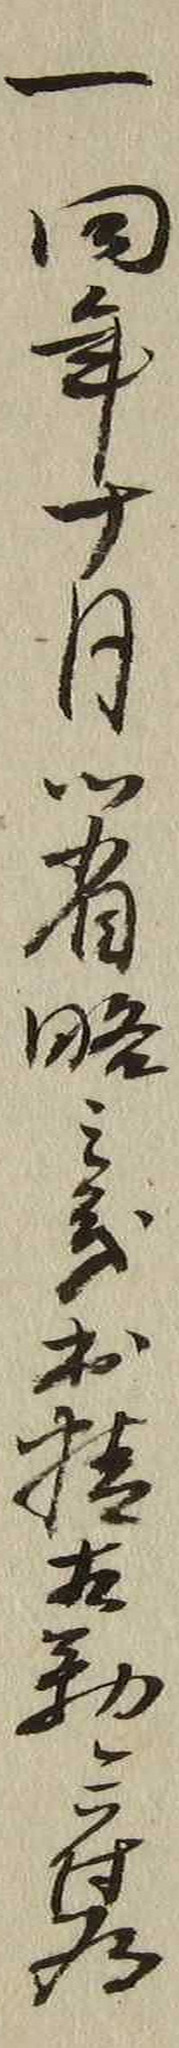一同年十月御省略之義出精相勤候ニ付為
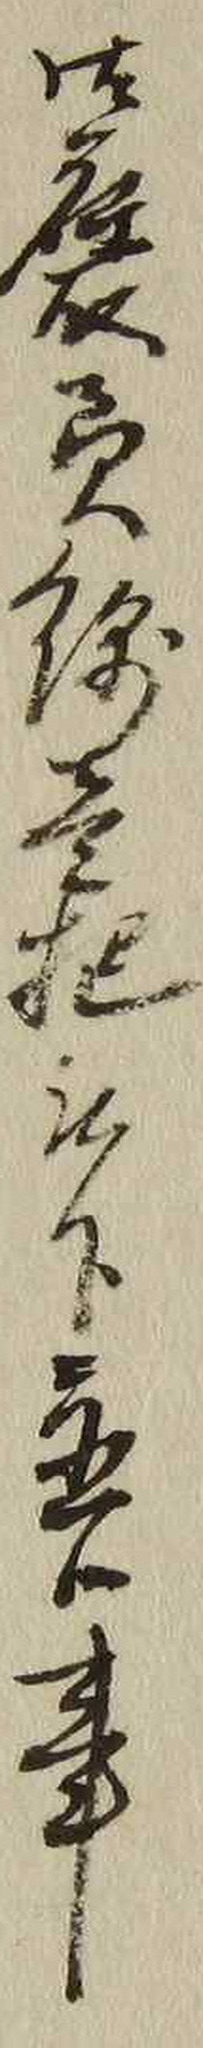御褒美綿壱把被下置候事
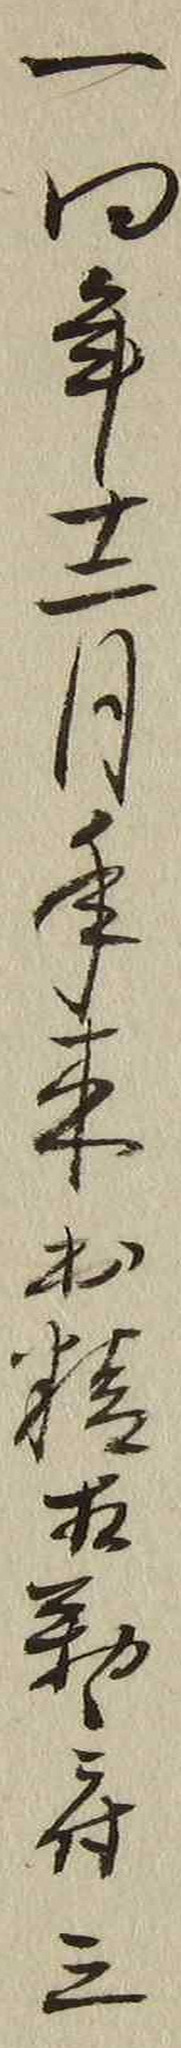一同年十二月年来出精相勤候ニ付三
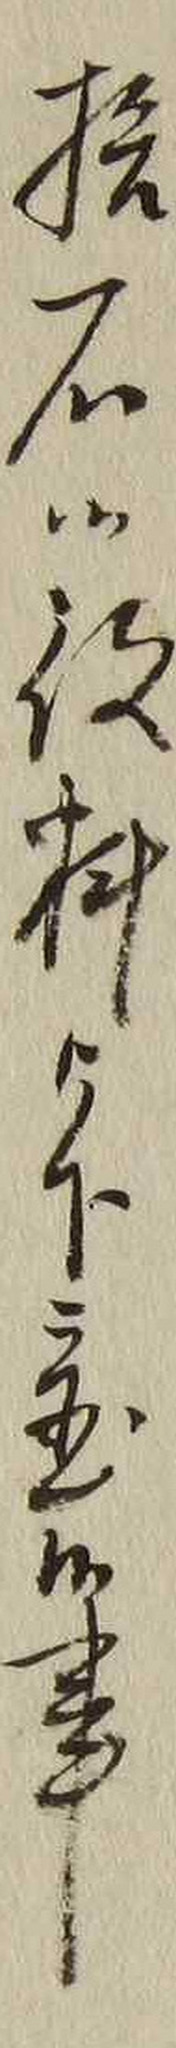拾石御役料被下置候事
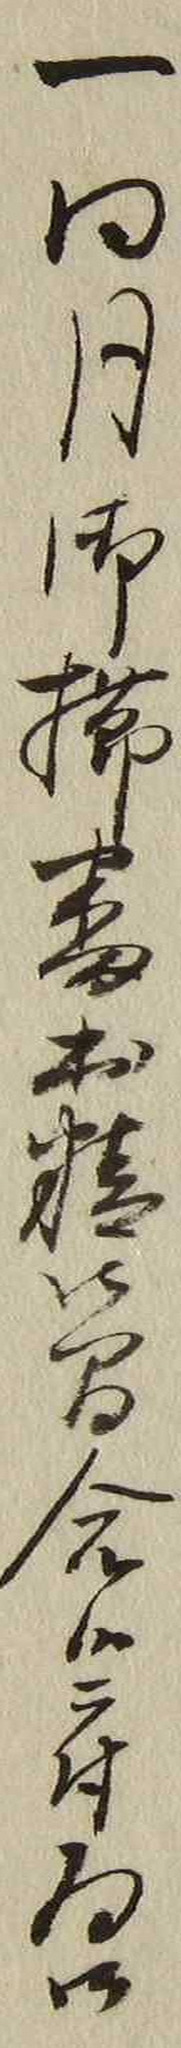一同月御櫛番出精御間合候ニ付為御
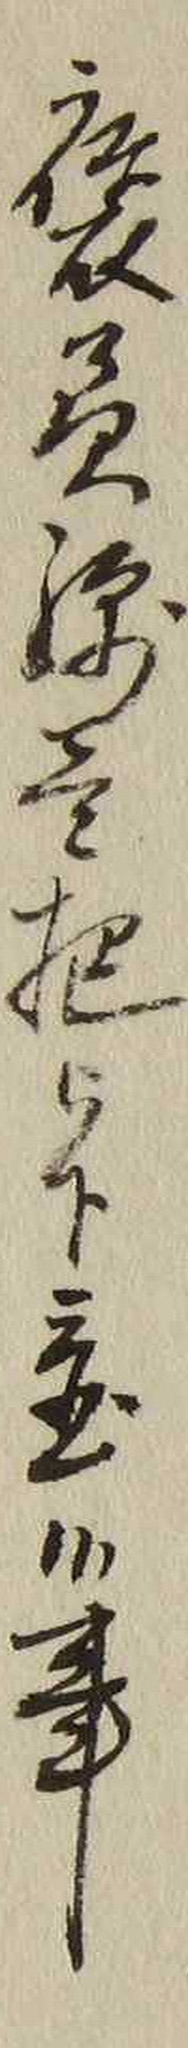褒美綿壱把被下置候事
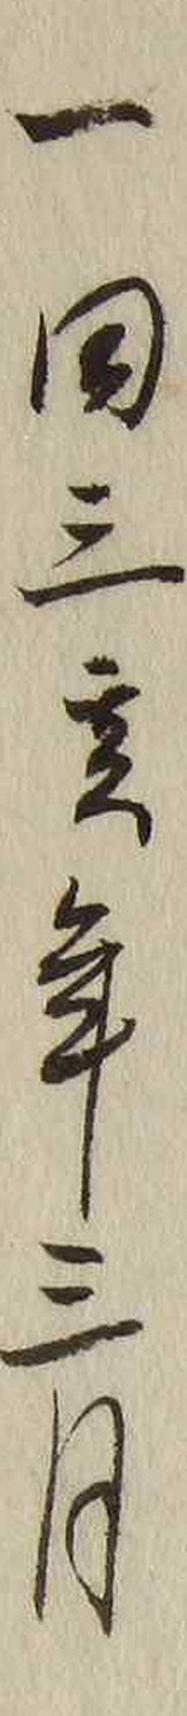一同三亥年三月
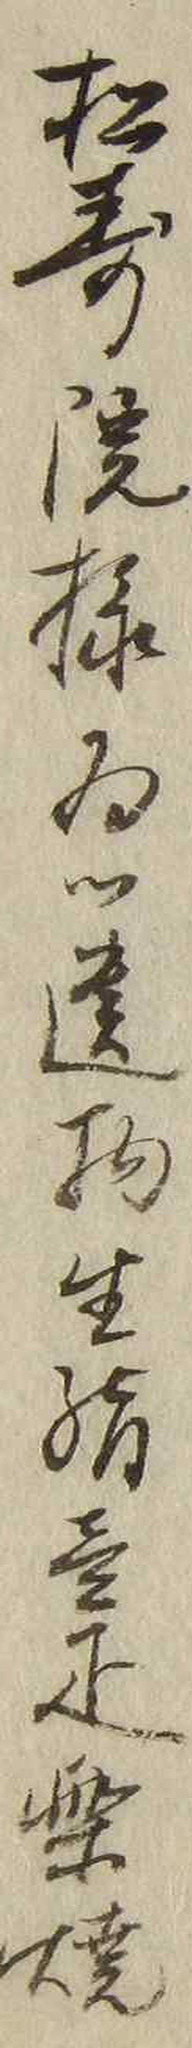松寿院様為御違物生絹壱疋楽焼

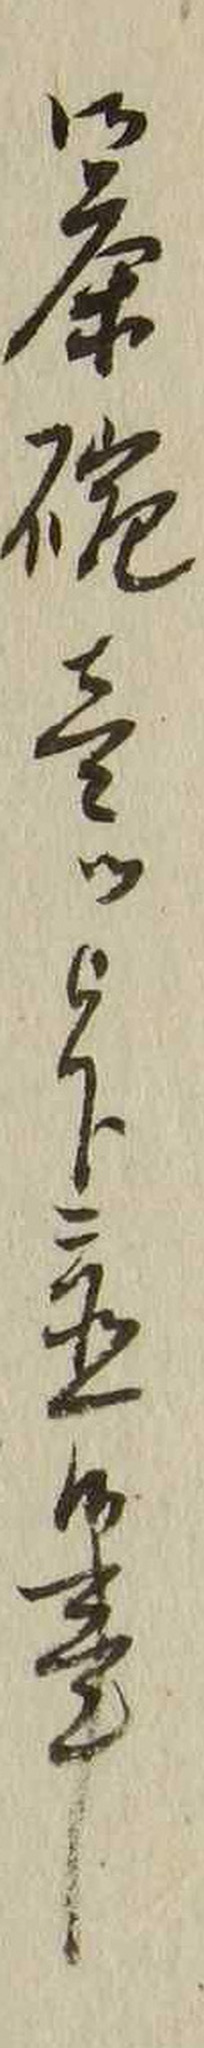御茶碗壱ツ被下置候事
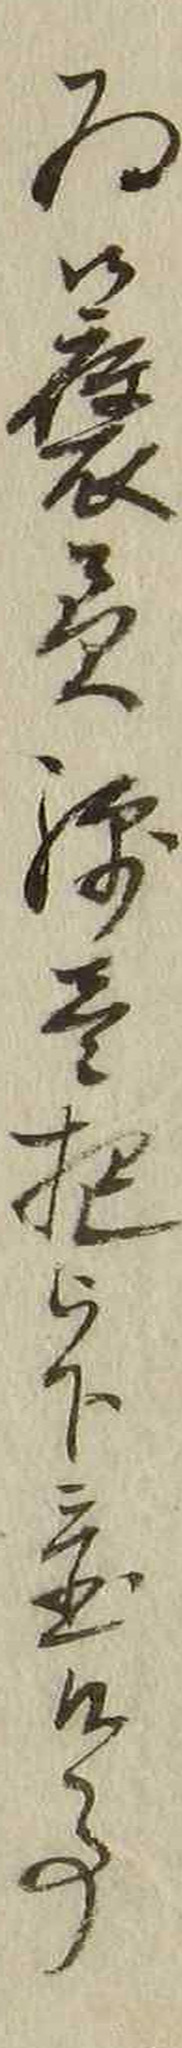為御褒美綿壱把被下置候事
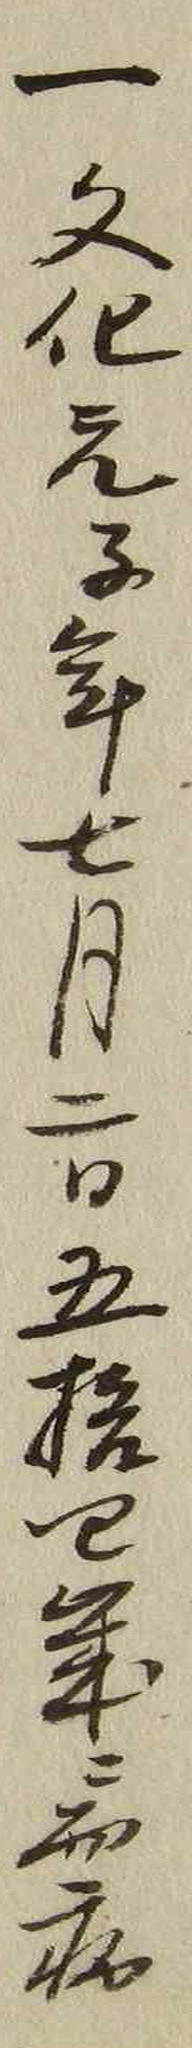一文化元子年七月二日五拾四歳ニ而病
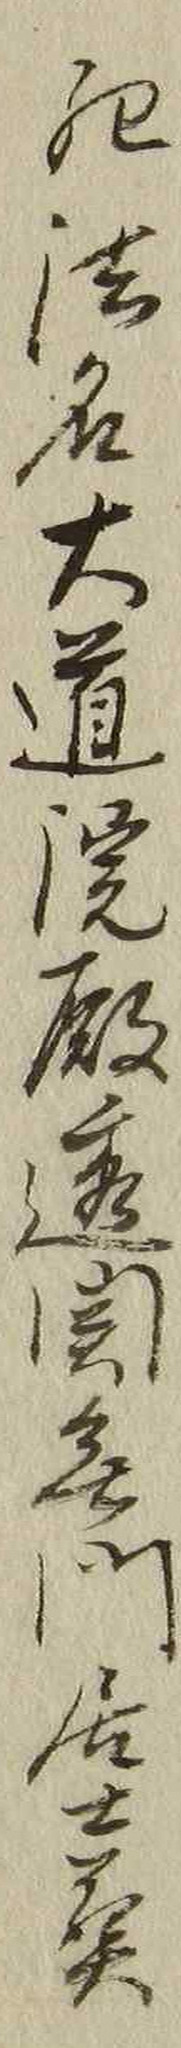死法名大道院殿透関無門居士葬
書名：諸士系譜　巻之359　す之部9
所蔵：会津若松市立会津図書館
